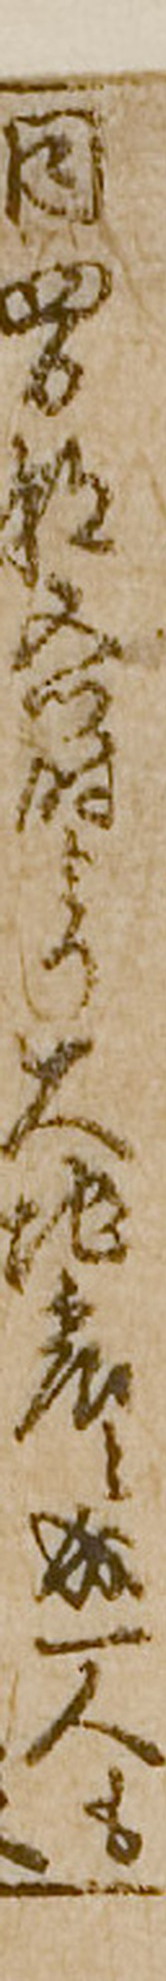同四日朝五ツ時より大地震と成一人も
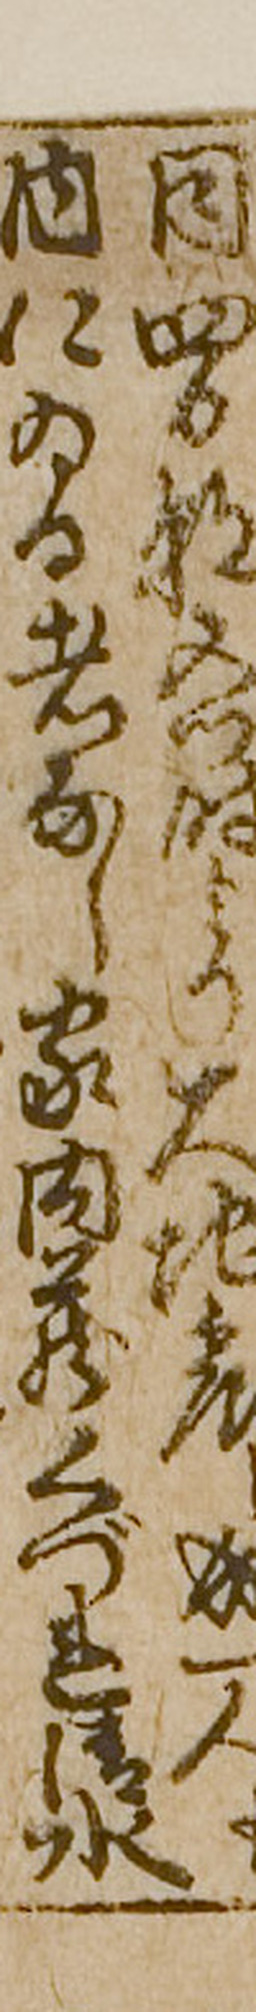内にゐる者なし家内蔵くづれ清水
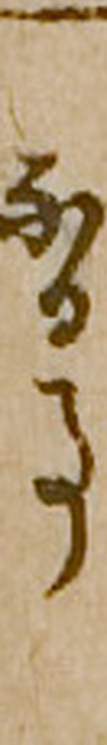なる事
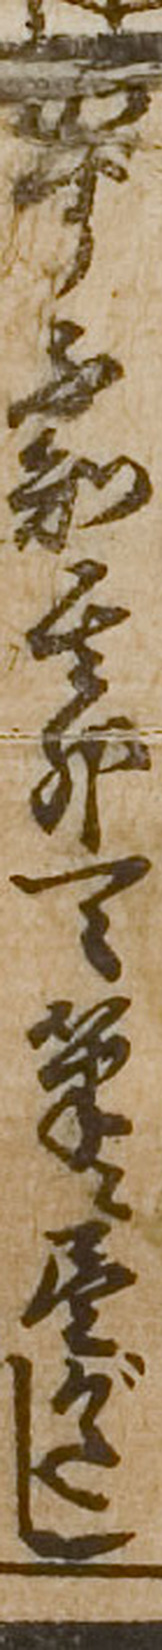かず不知其外一々筆ニ尽がたし
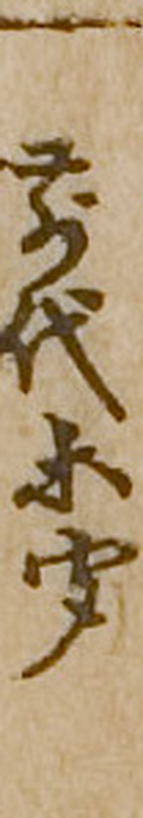前代未聞
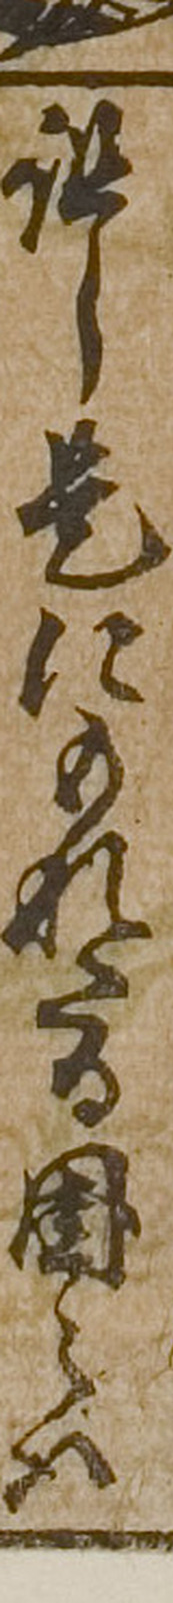但し是にもれたる国々ハ
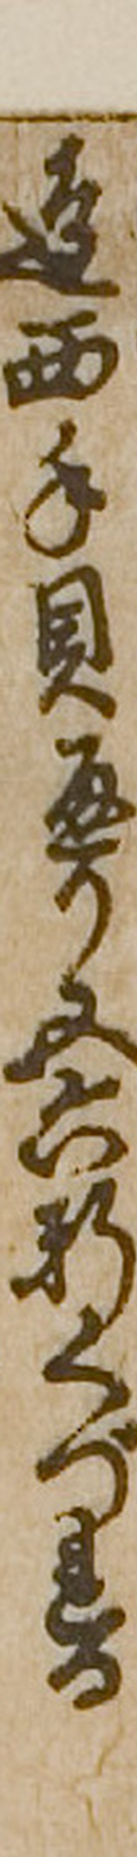辺西手貝通り五六軒くづれる
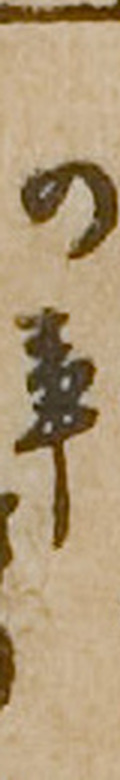の事なり
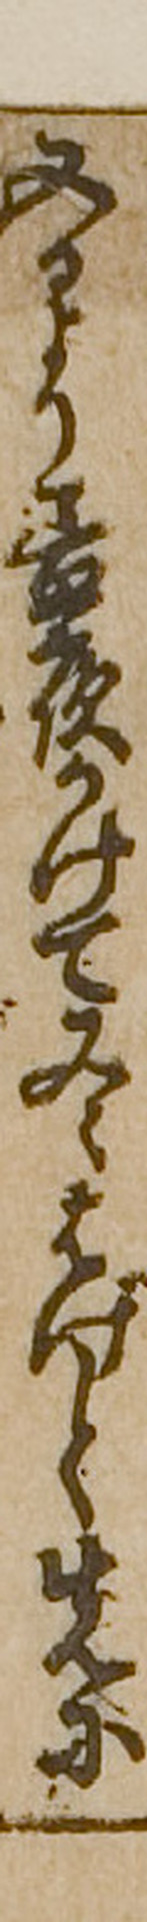五日より昼夜かけて又々はげしく先に
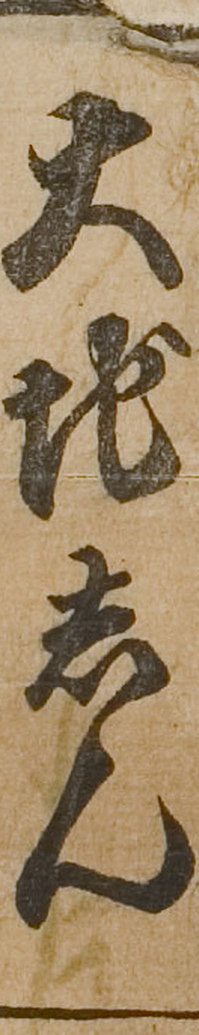大地しん
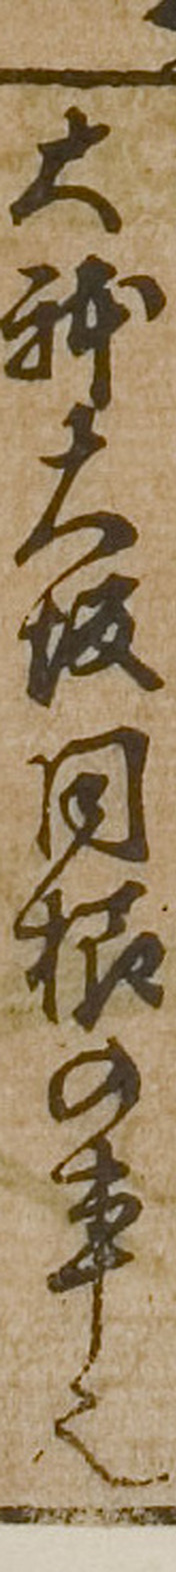大体大坂同様の事也
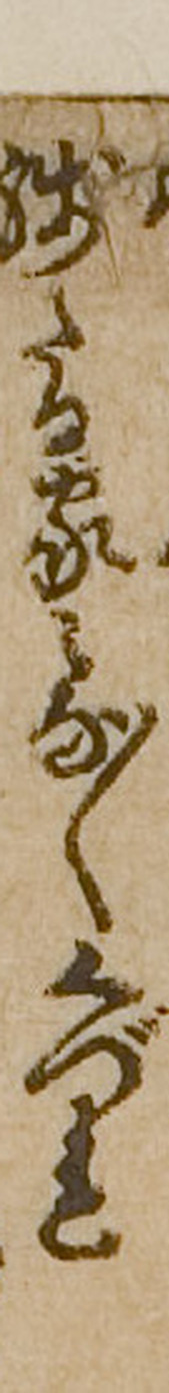残たる家みな〳〵くづれ
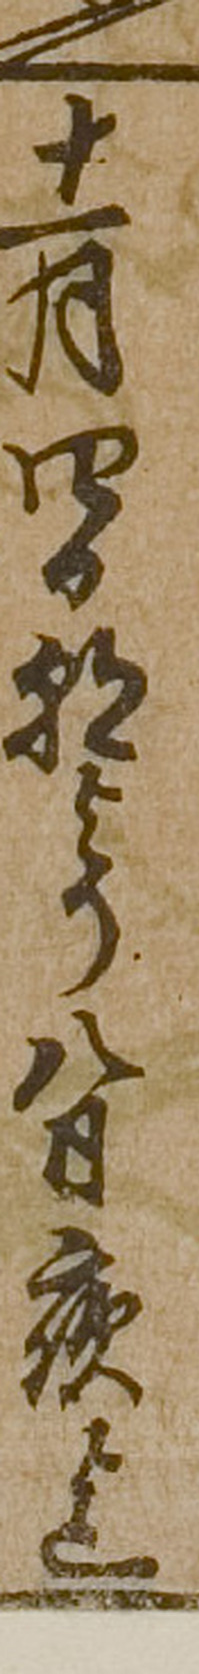十一月四日朝より八日夜迄
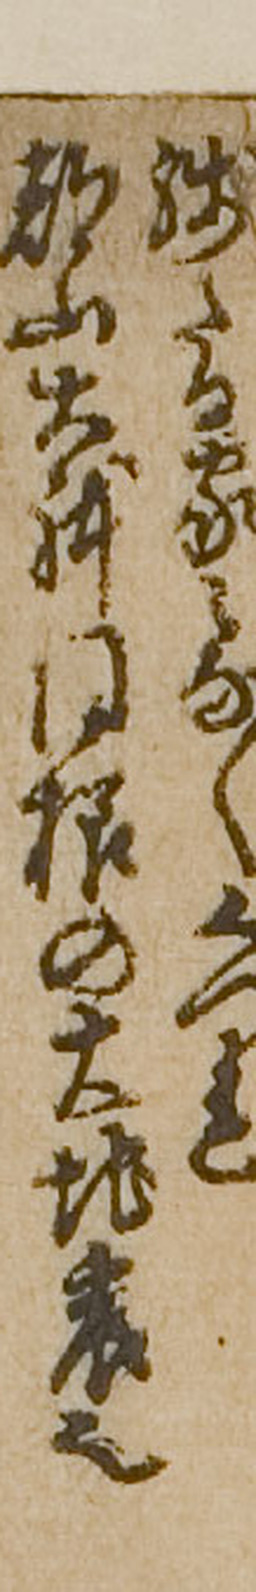郡山大体同様の大地震也
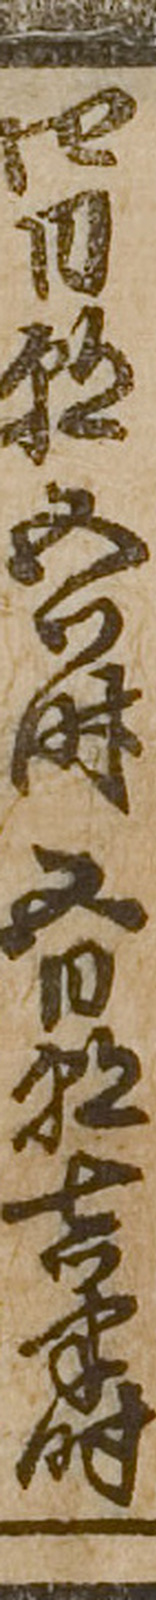四日朝五ツ時五日朝七ツ半時
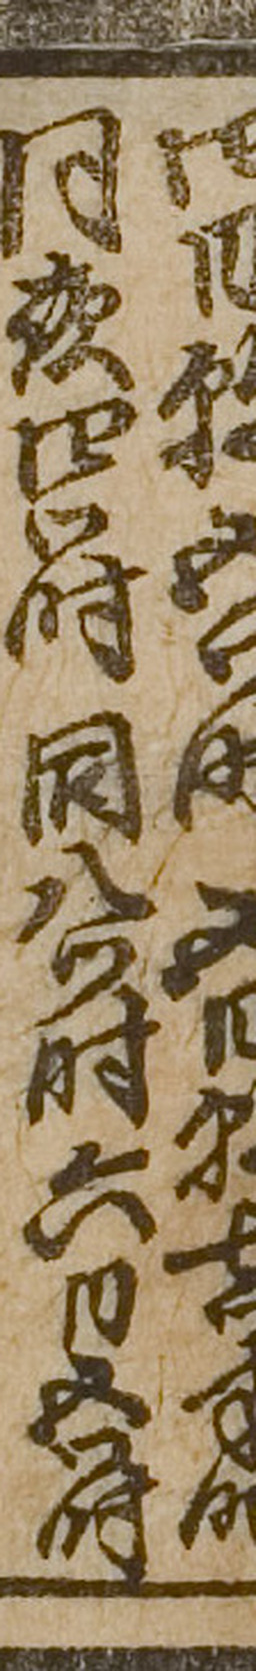同夜四ツ時同八ツ時六日五ツ時
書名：[大坂つなみ]
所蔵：東京大学総合図書館 General Library in the University of Tokyo, JAPAN
